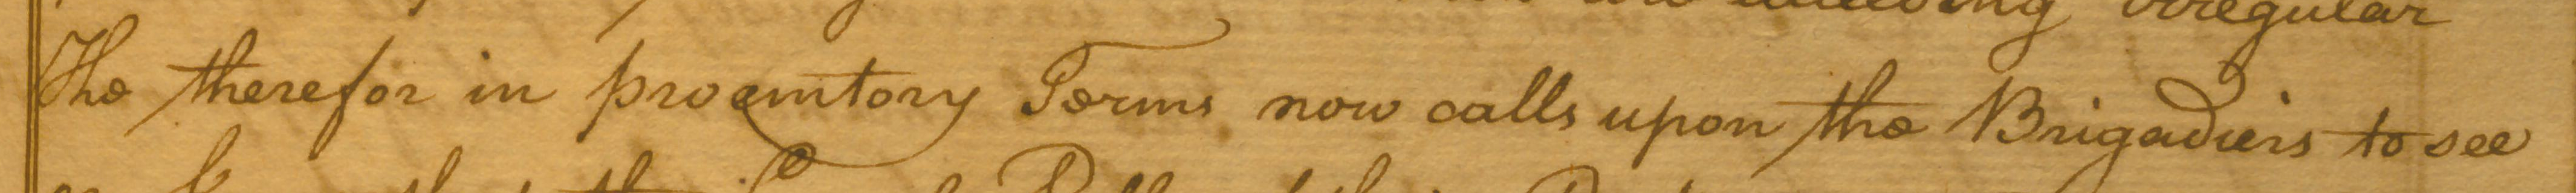He therefor in preemtory Terms now calls upon the Brigadiers to see
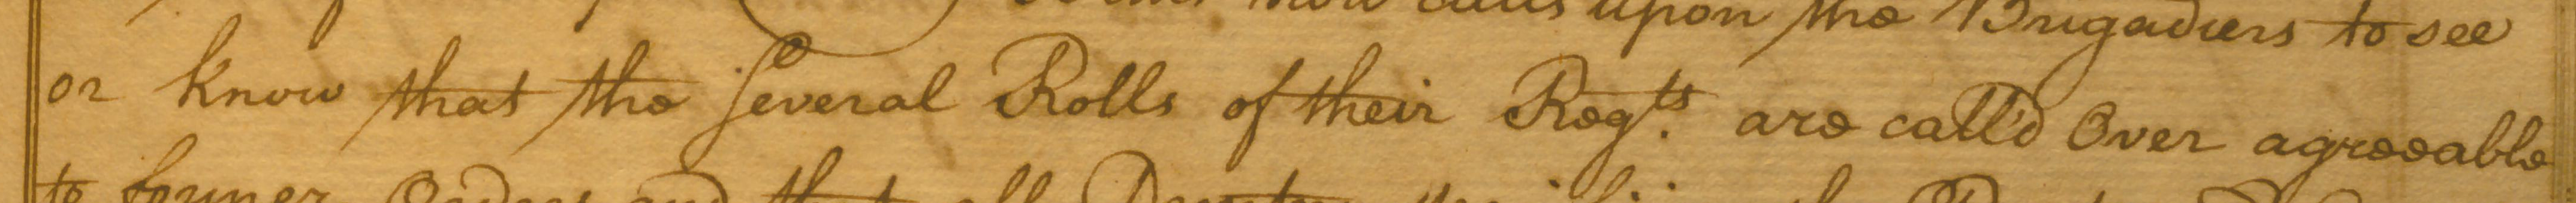or know that the several Rolls of their Reg^ts. are call'd over agreeable
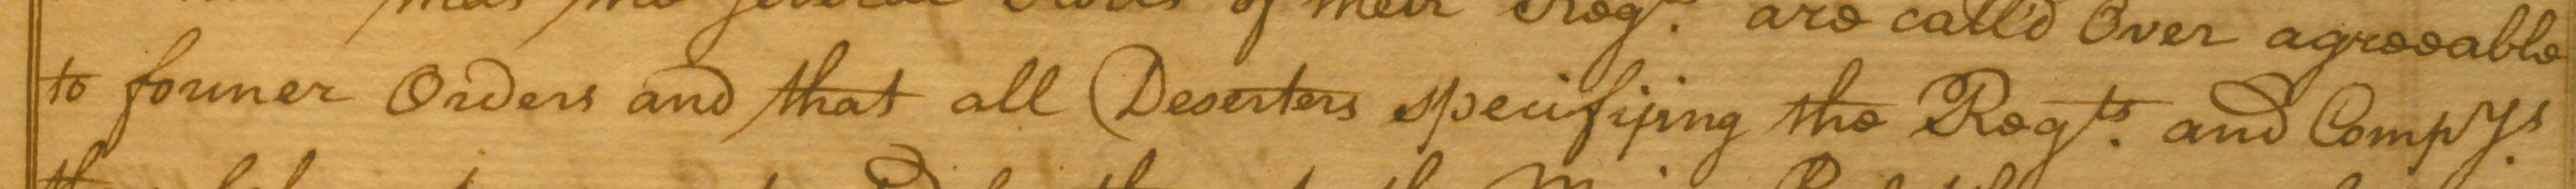to former Orders and that all Deserters specifying the Reg^ts. and Comp^ys.
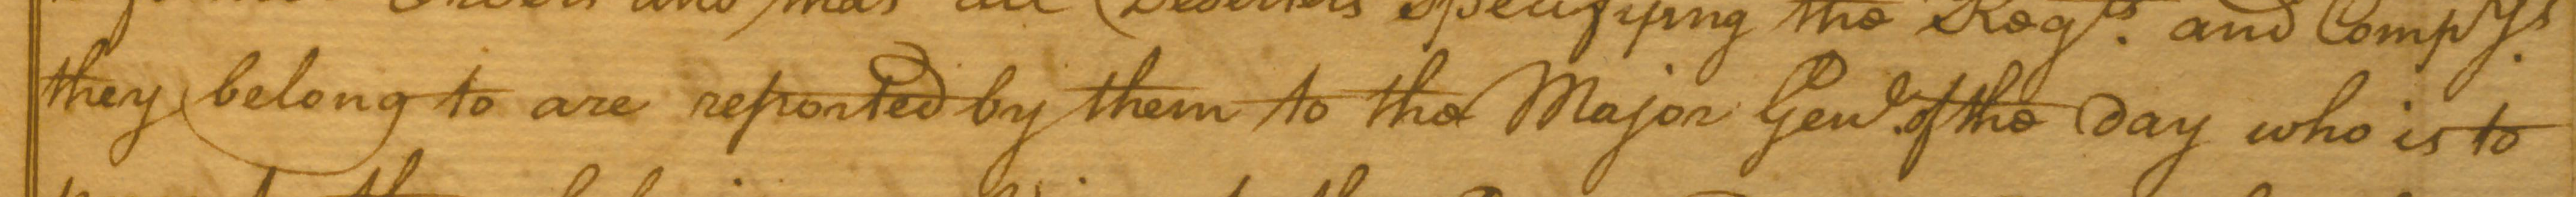they belong to are reported by them to the Major Gen^l. of the day who is to
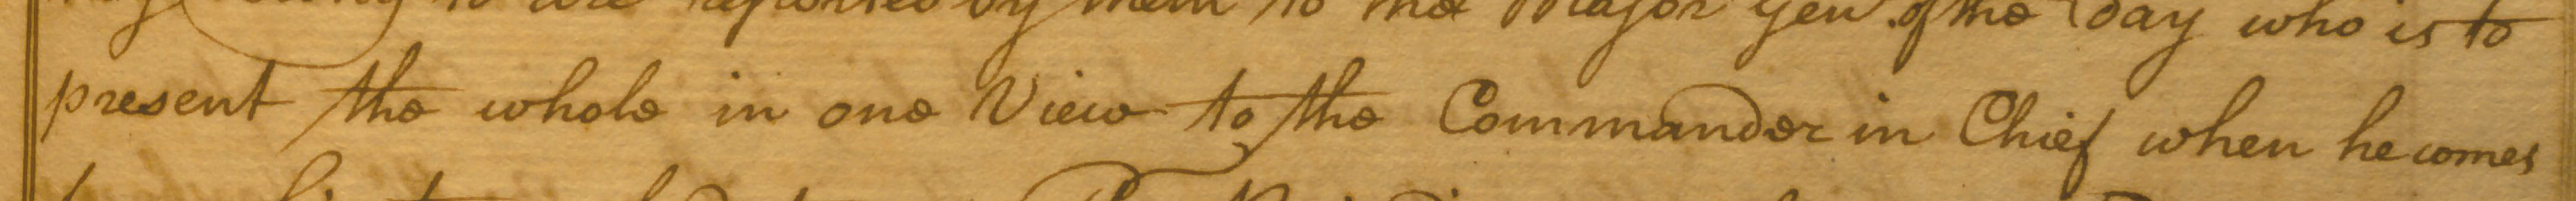present the whole in one View to the Commander in Chief when he comes
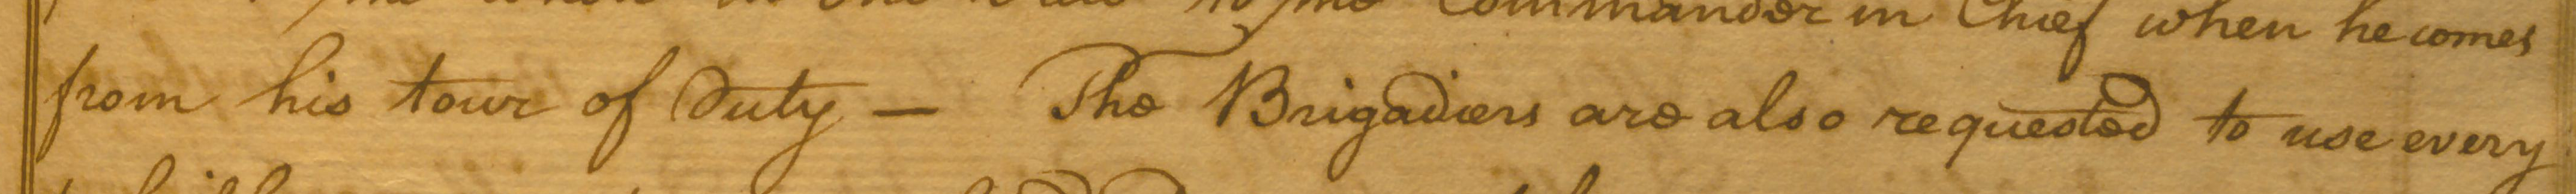from his tour of duty- The Brigadiers are also requested to use every
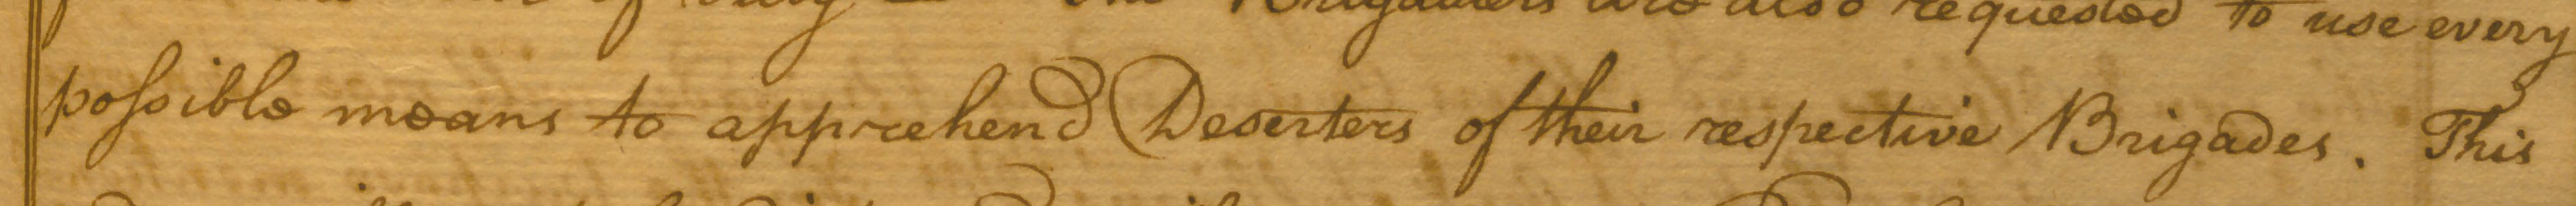possible means to apprehend Deserters of their respective Brigades. This
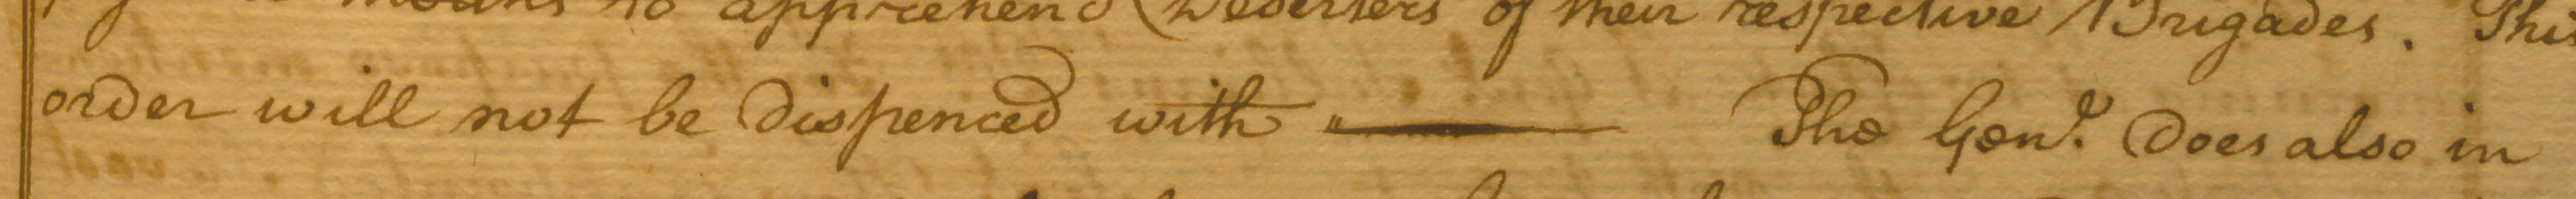order will not be dispensed with- The Gen^l. does also in
